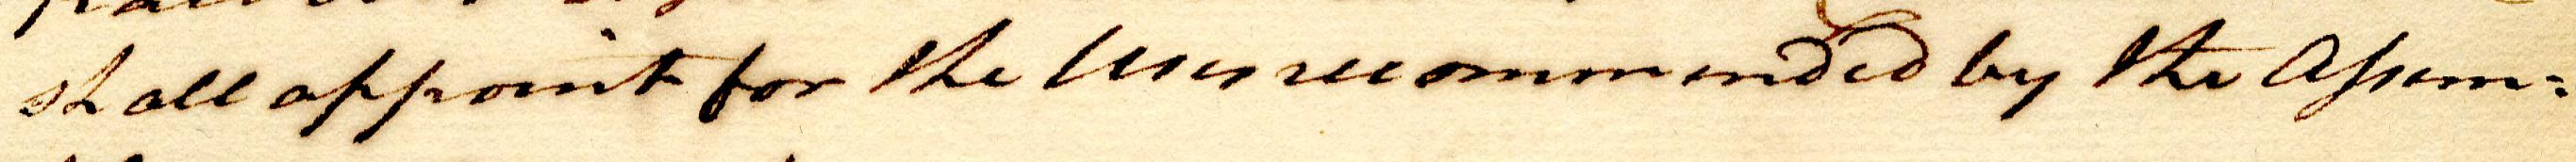shall appoint for the Uses recommended by the Assem-
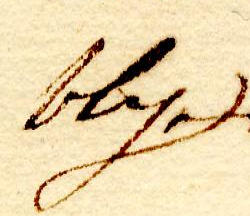-bly.
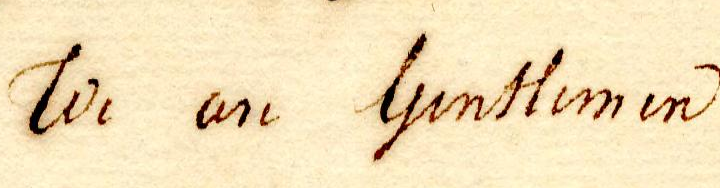We are Gentlemen
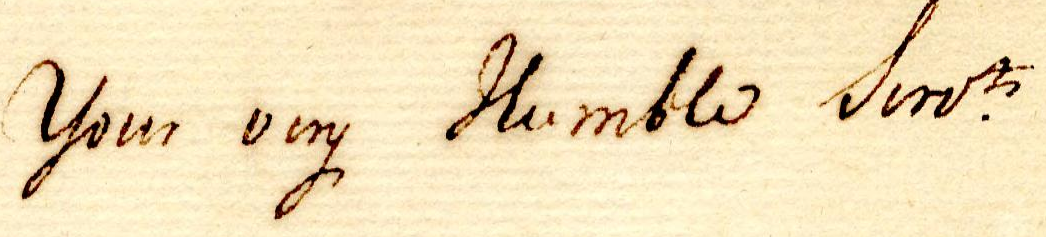Your very Humble Serv^t.
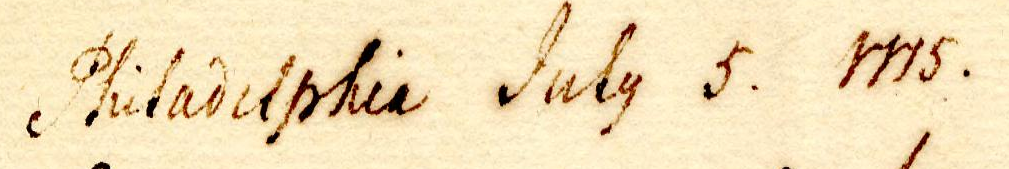Philadelphia July 5. 1775.
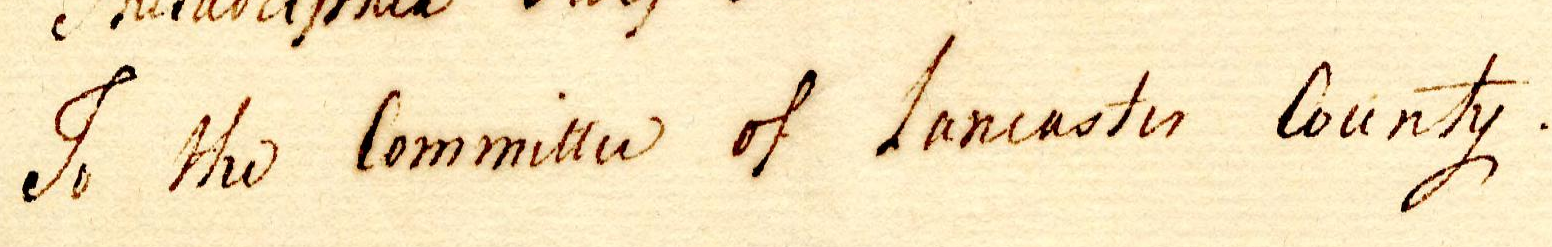To the Committee of Lancaster County.
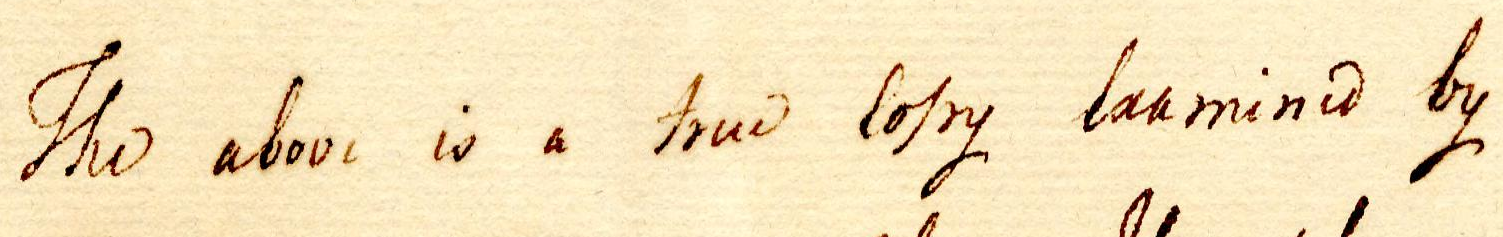The above is a true Copy Examined by
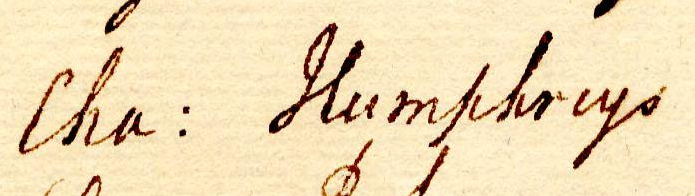Cha: Humphreys
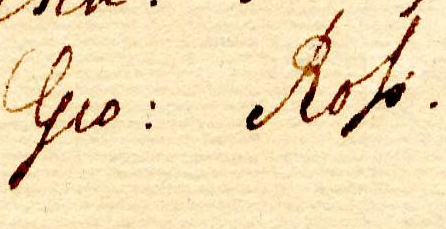Geo: Ross.
